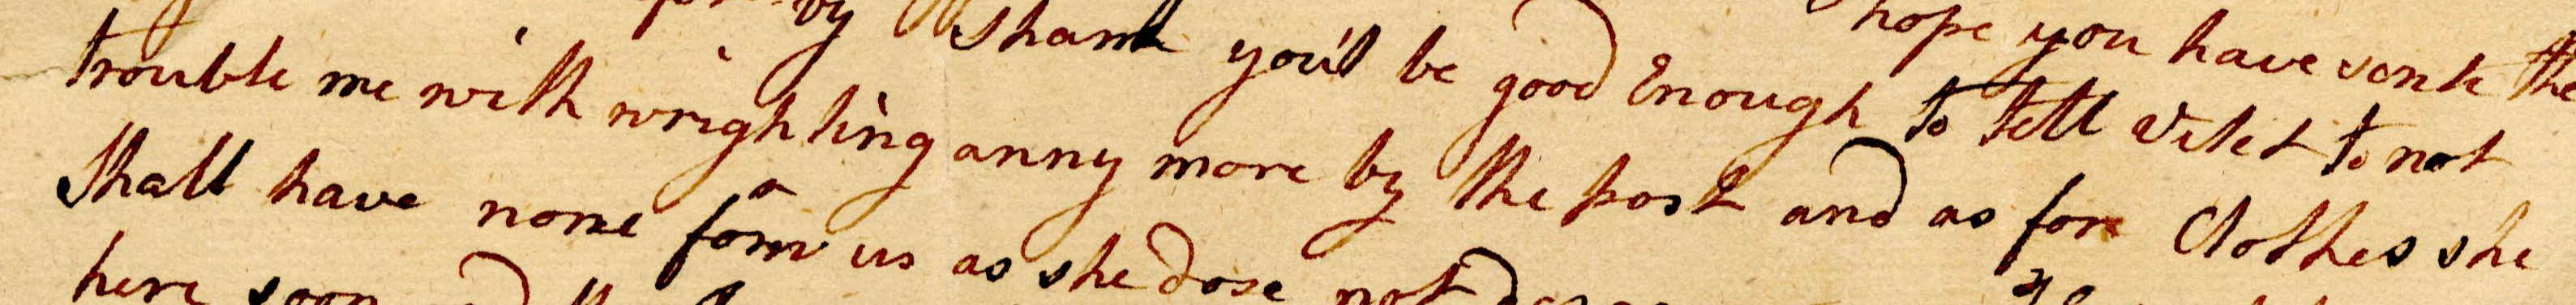trouble me with wrighting anny more by the post and as for clothes she
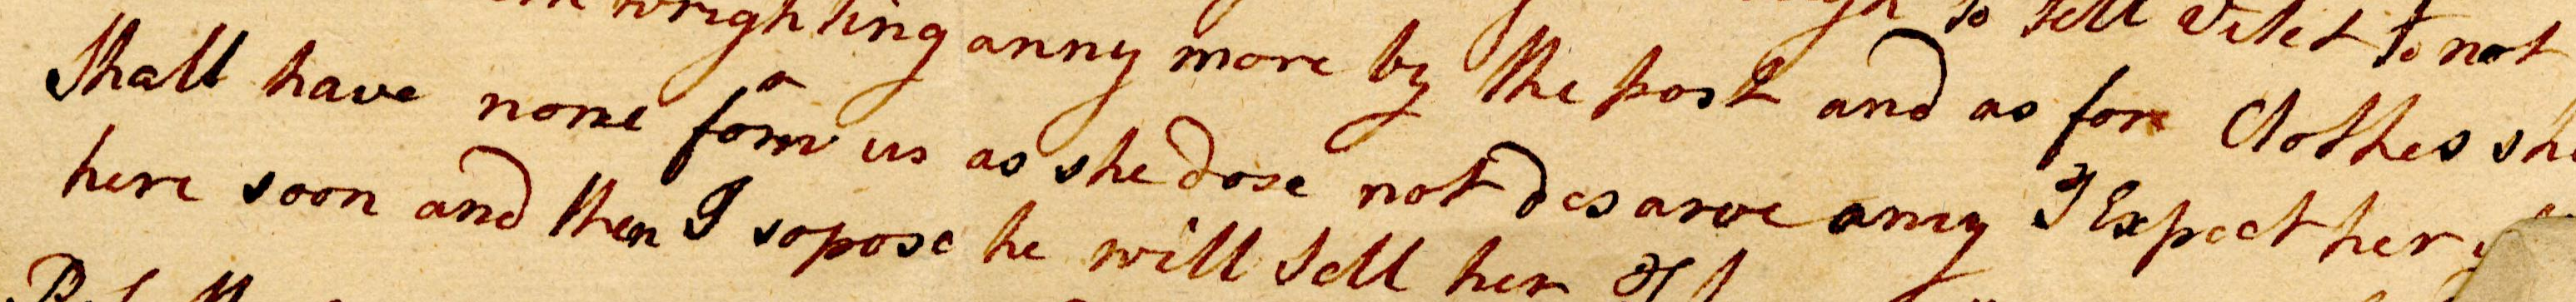Shall have none from us as she dose not desarve anny I Expect her
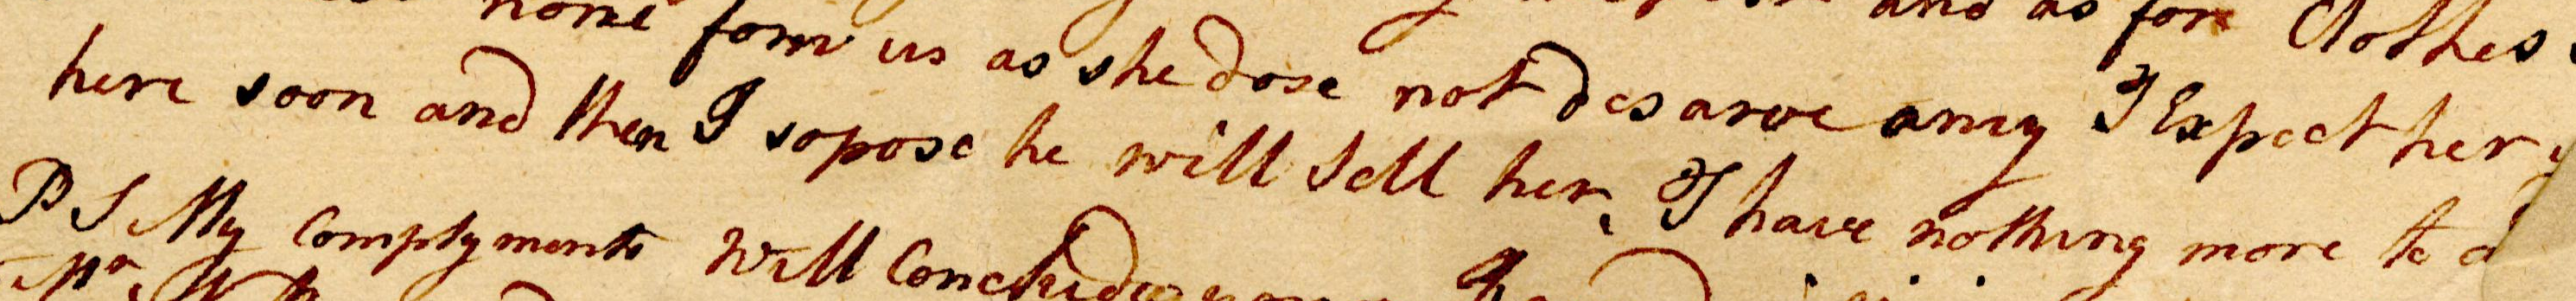here soon and then I sopose he will Sell her. I have nothing more to
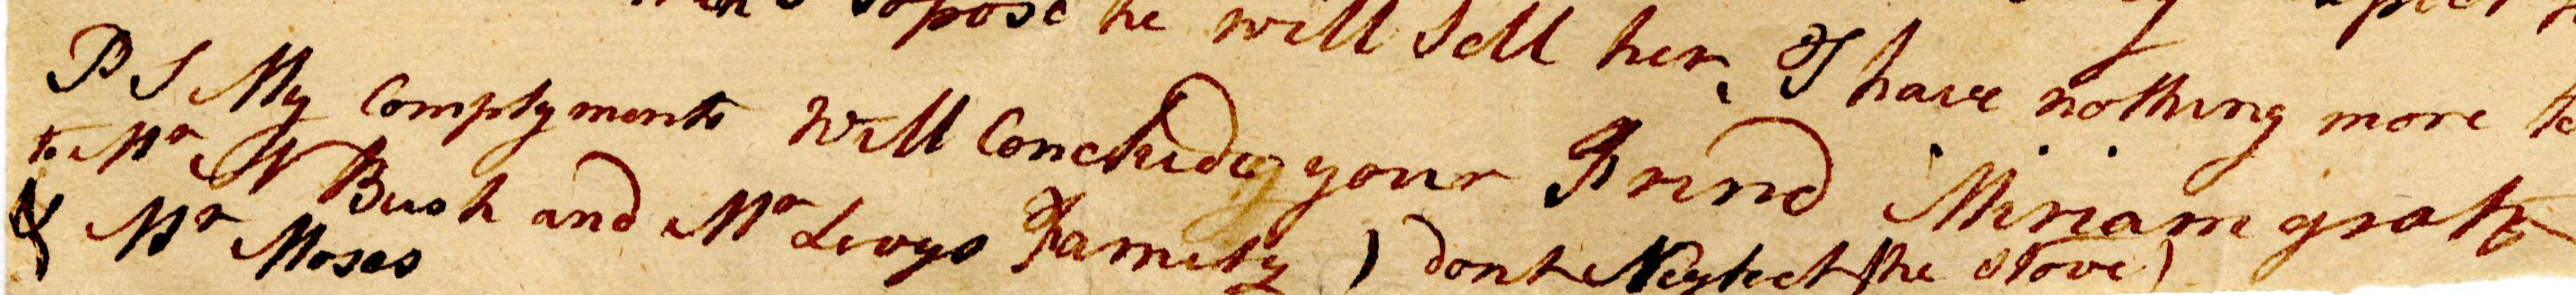PS My compliments will conclude your Friend Miriam gratz
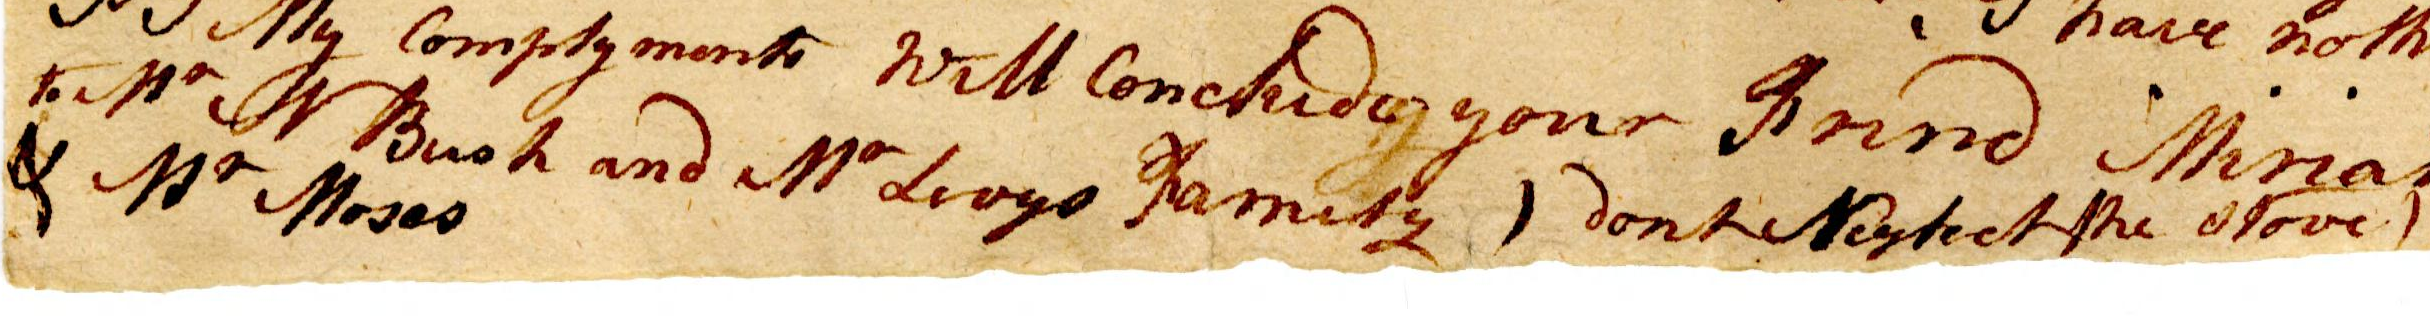to M^r W Bush and M^r Levys Family I dont Neglect the stove
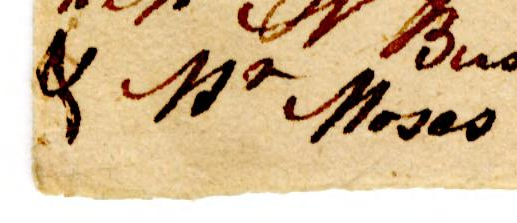& M^r Moses
